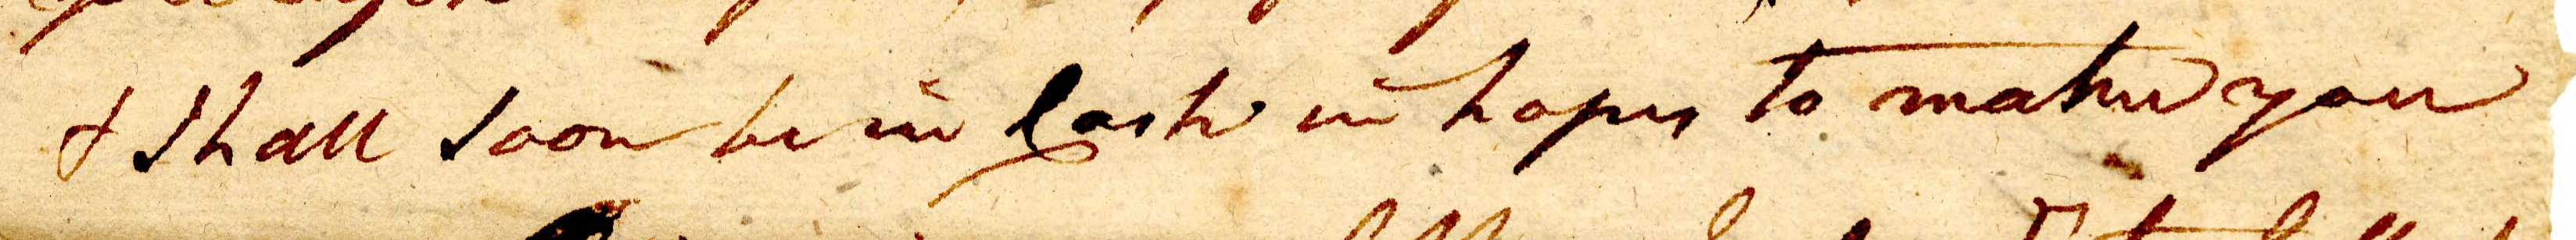& shall soon be in cash in hopes to make you
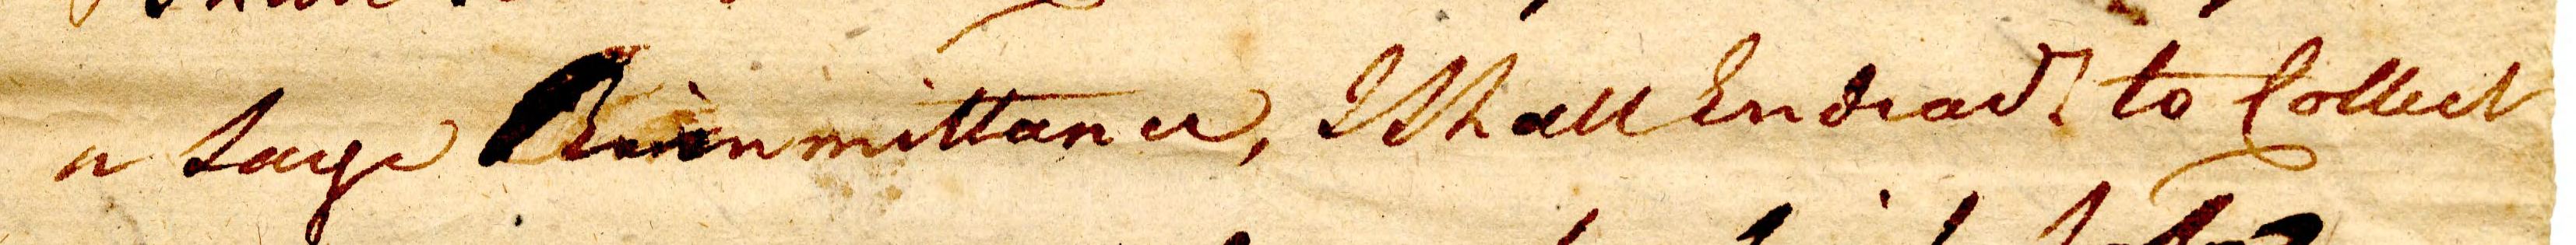in Large Reinmittance, I shall Endeav^r. to Collect
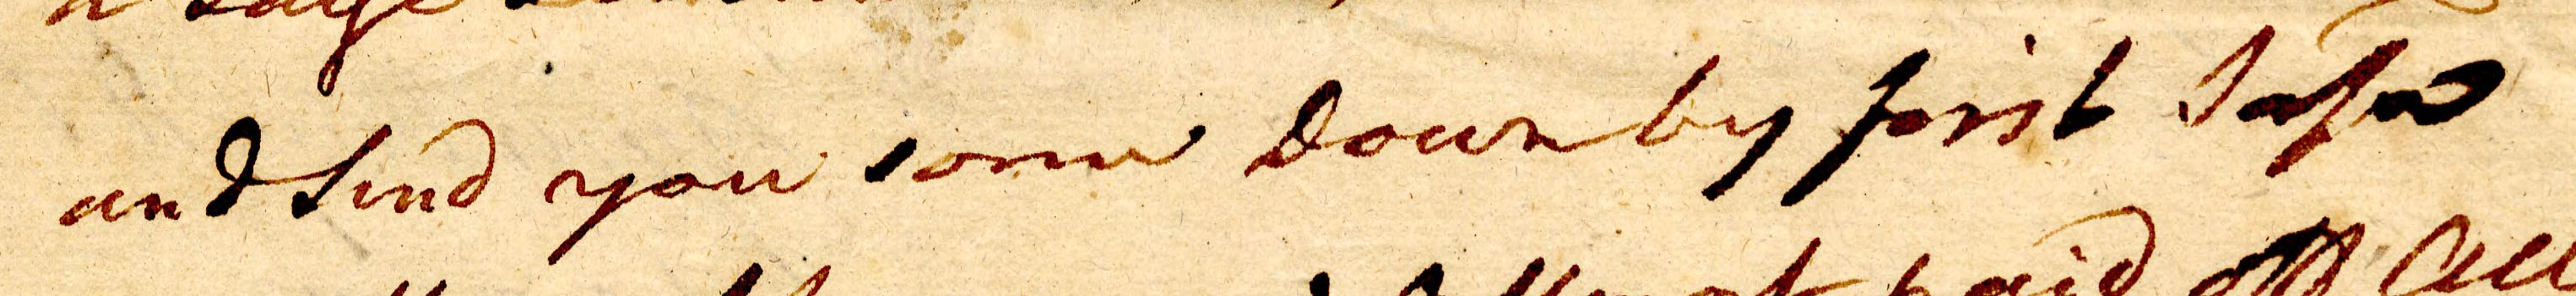and send you some Down by first safe
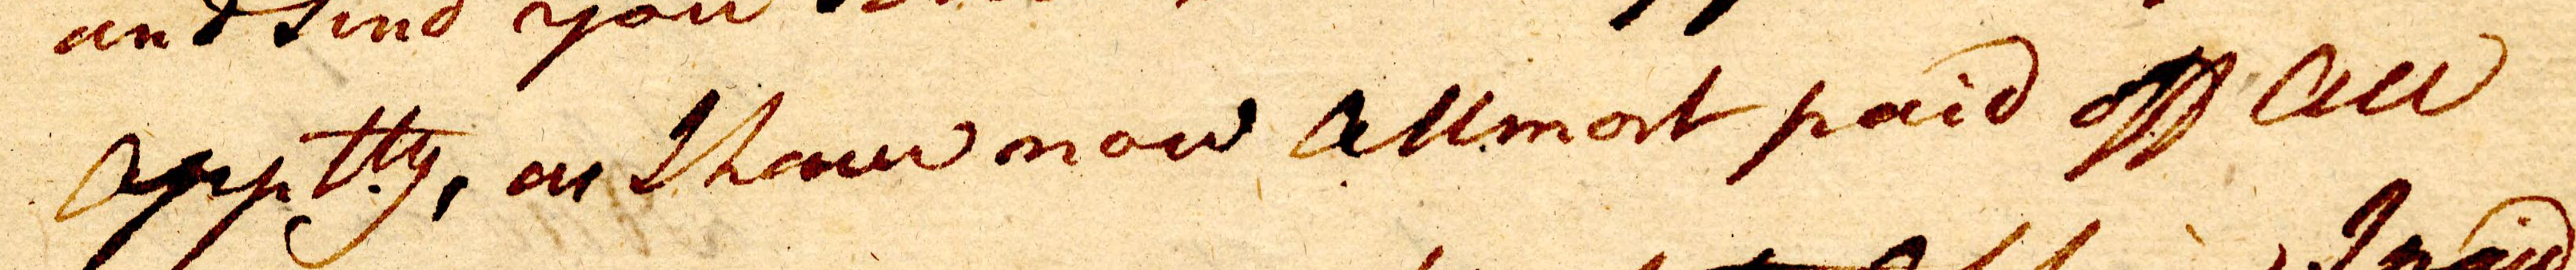opp^tty., as I have now Allmost paid off all
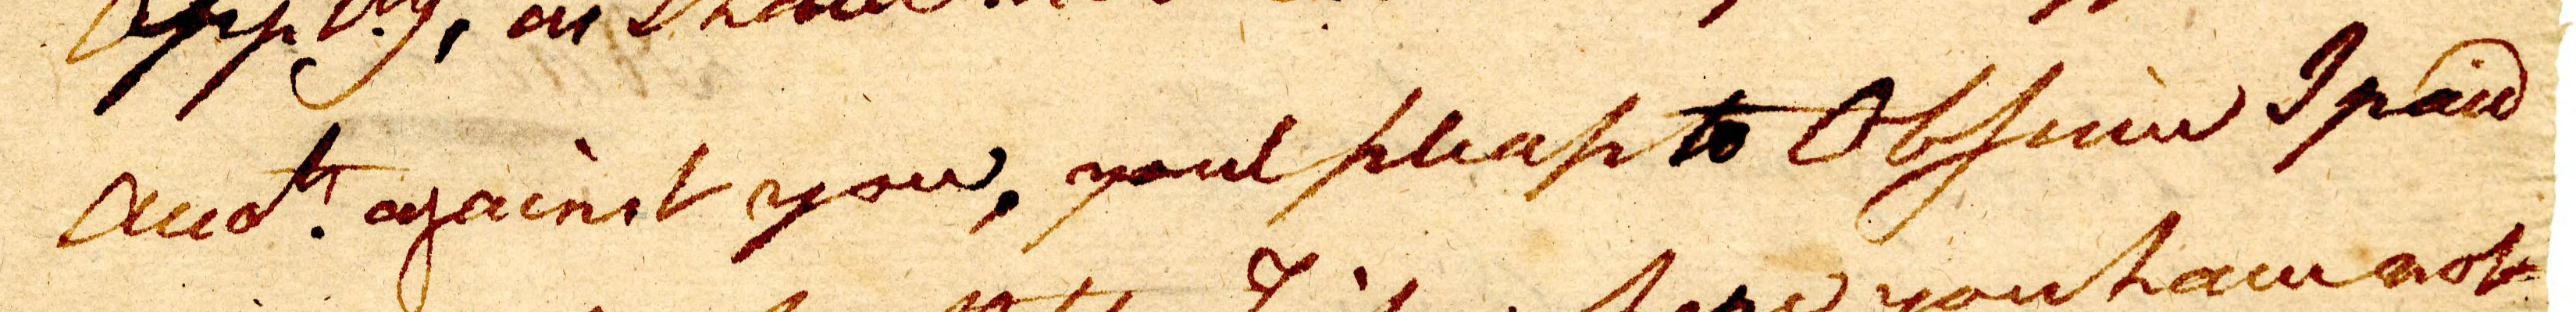Acco^ts. against you, you please to Observe I paid
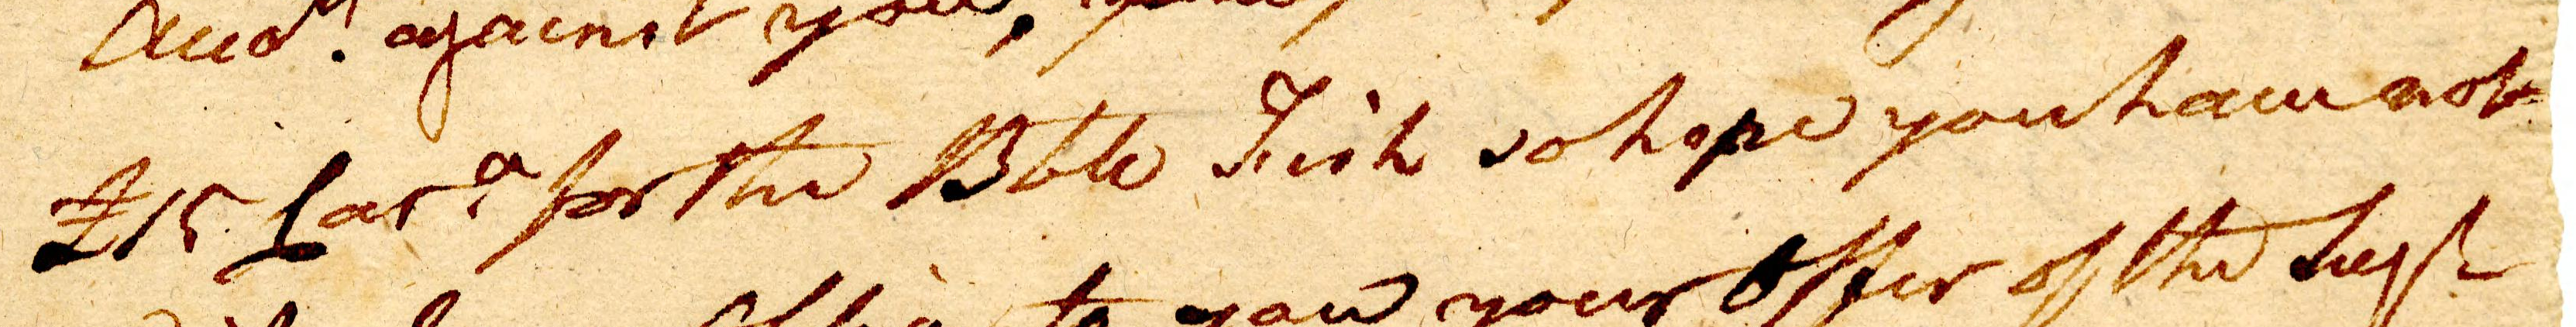£15. Car^a. for the Bble Fish so hope you have not
